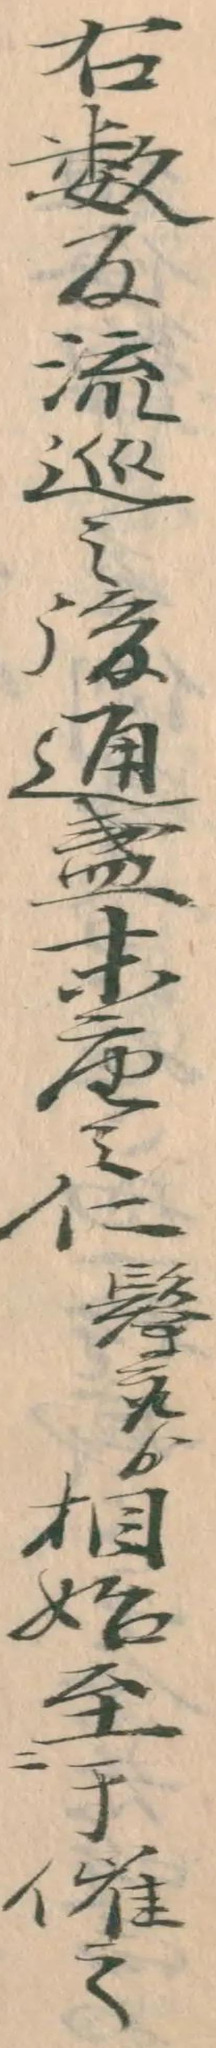右数反流巡之後通盞末座之仁髪取ゟ相始至于催也
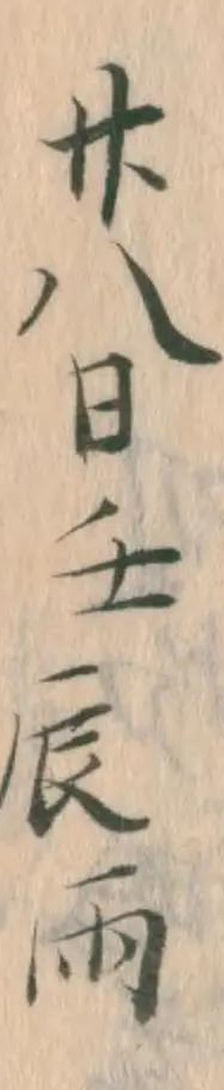廿八日壬辰雨
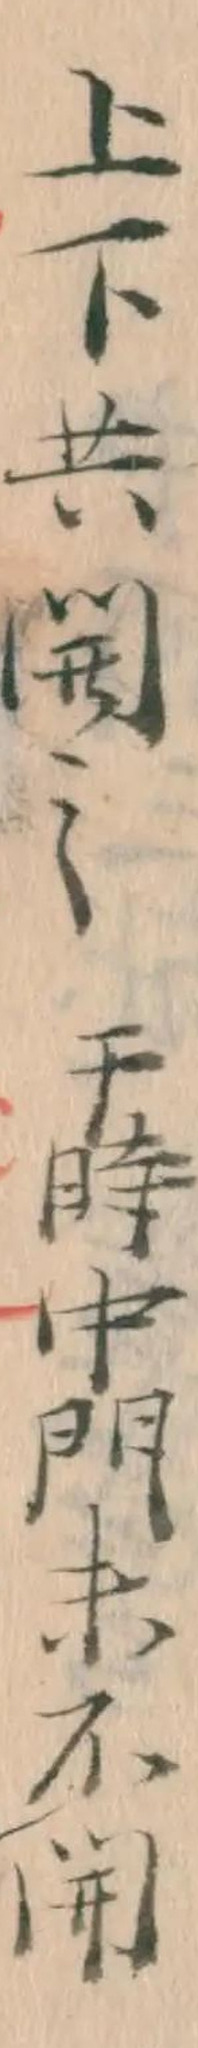上下共開之于時中門未不開
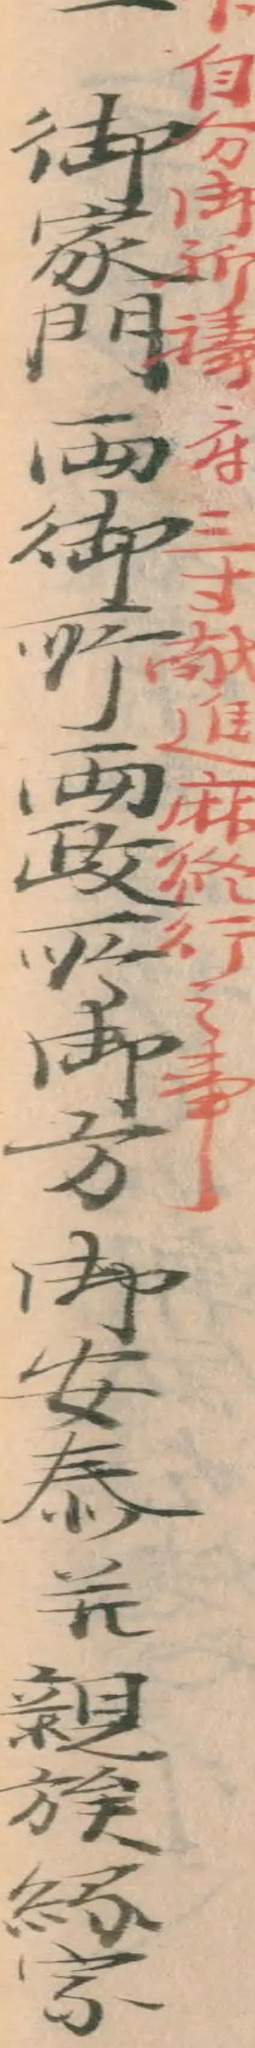一御家門両御所両政所御方御安泰并親族縁家
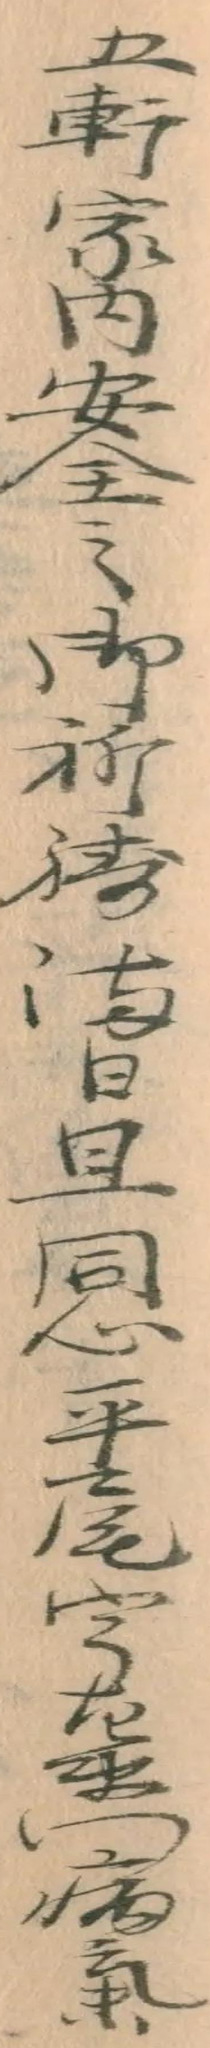五軒家内安全之御祈祷満日且同心平尾宇左衛門病氣
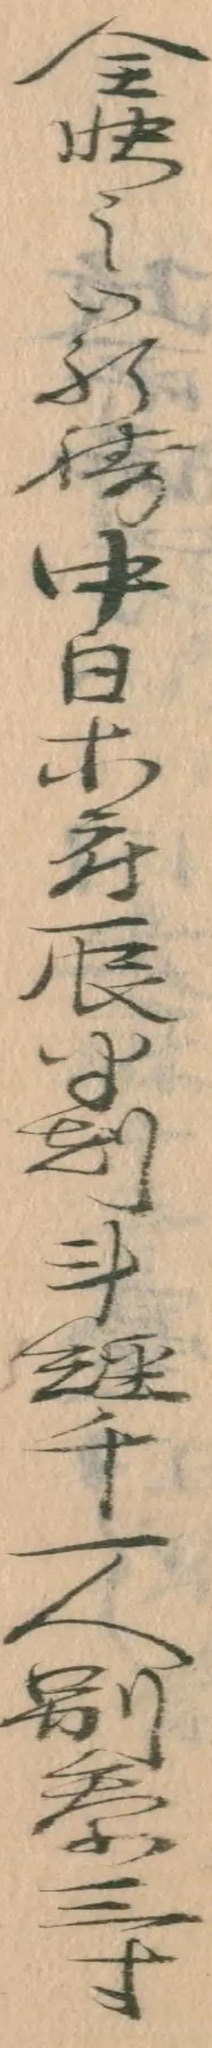全快之御祈祷中日等ニ付辰半刻斗経千一人別参三寸
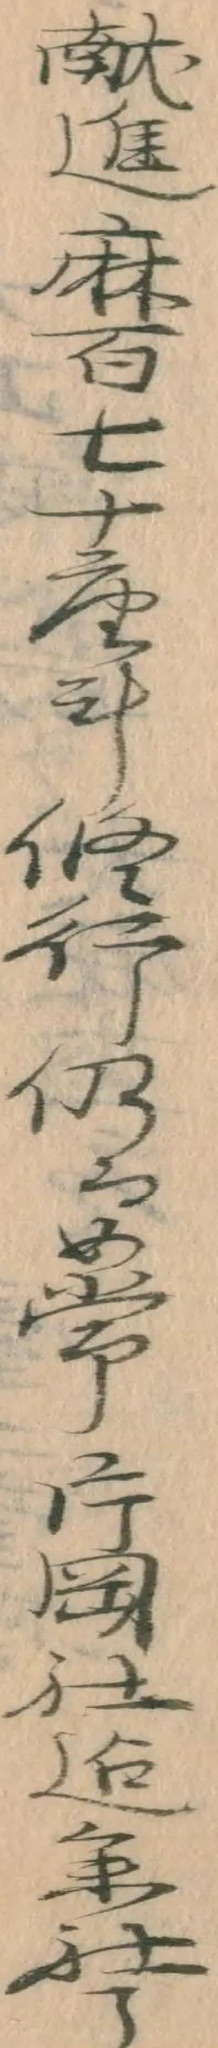献進麻百七十座斗修行仍而如常片岡社迄参社了
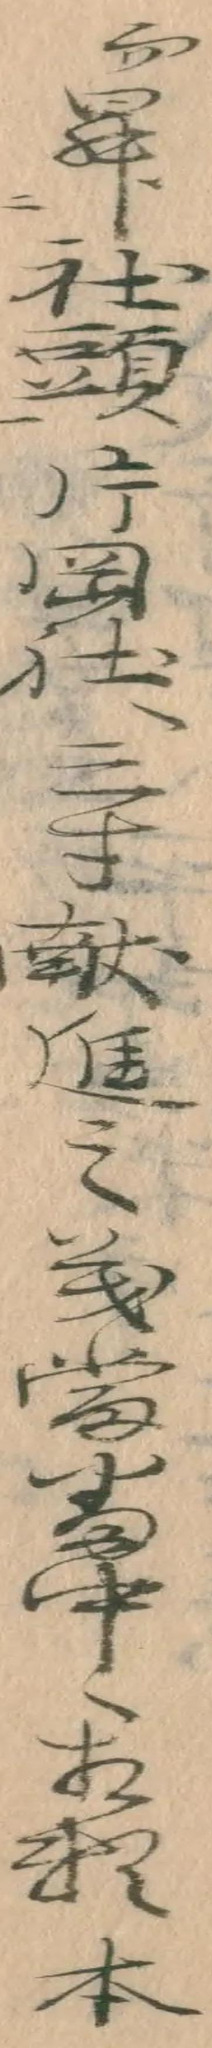而昇社頭片岡社へ三寸献進之義當番中へ相頼本
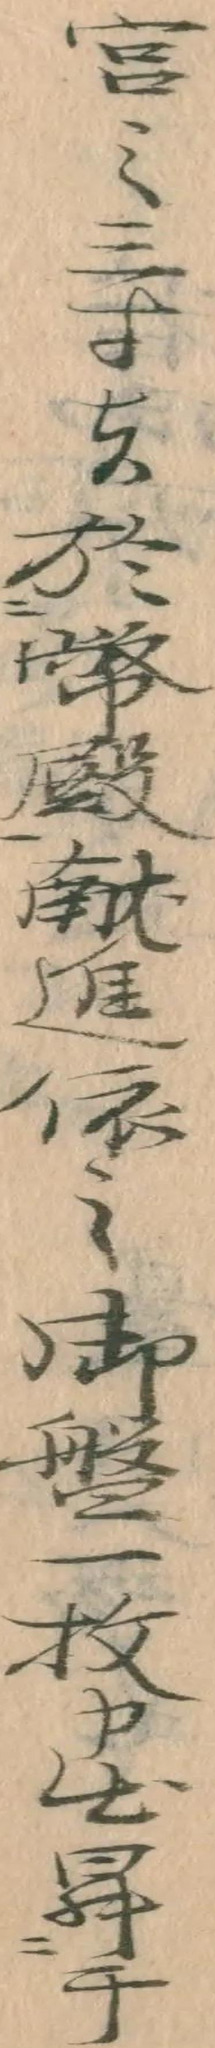宮之三寸者於二幣殿献進依之御盤一枚申出昇于
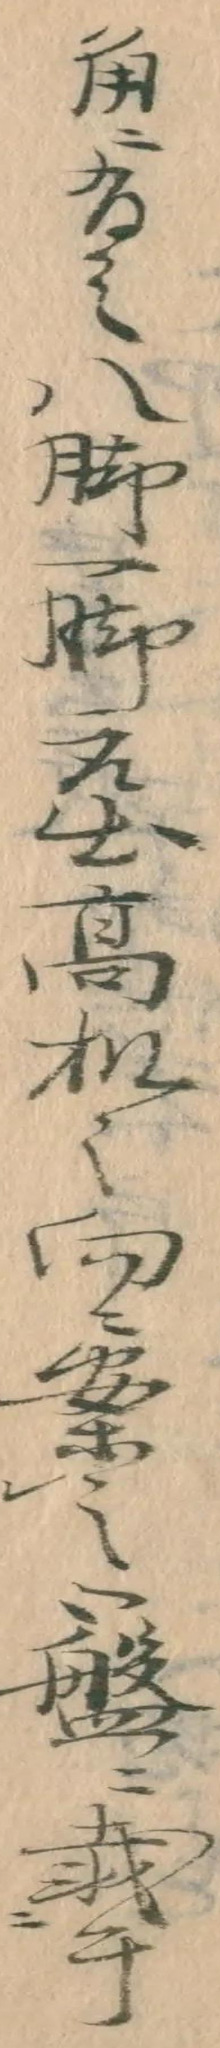角ニ有之八脚一脚取出高机之向ニ案之御盤ニ載于

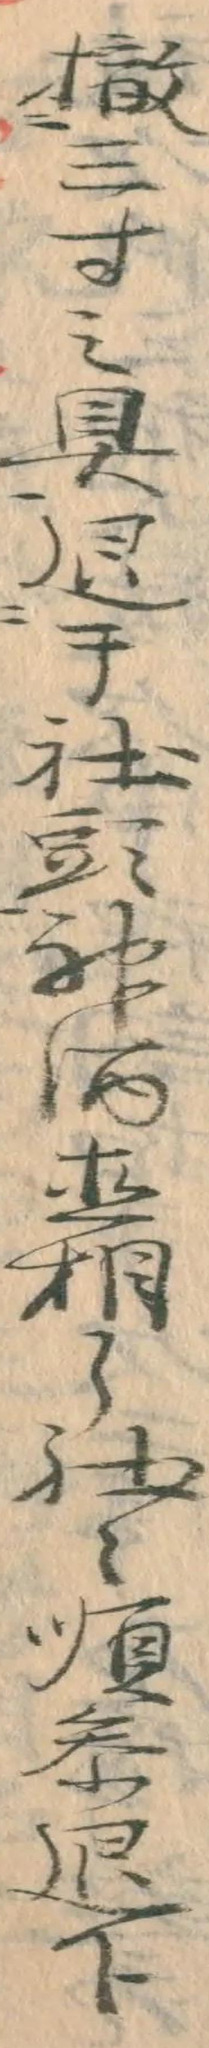撒三寸之具退于社頭神酒直相了社〻順参退下
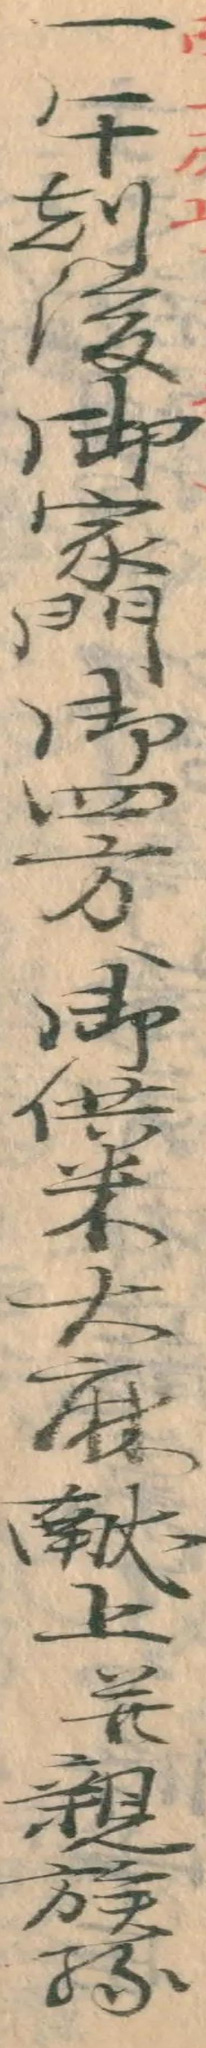一午刻後御家門御四方へ御供米大麻献上并親族縁
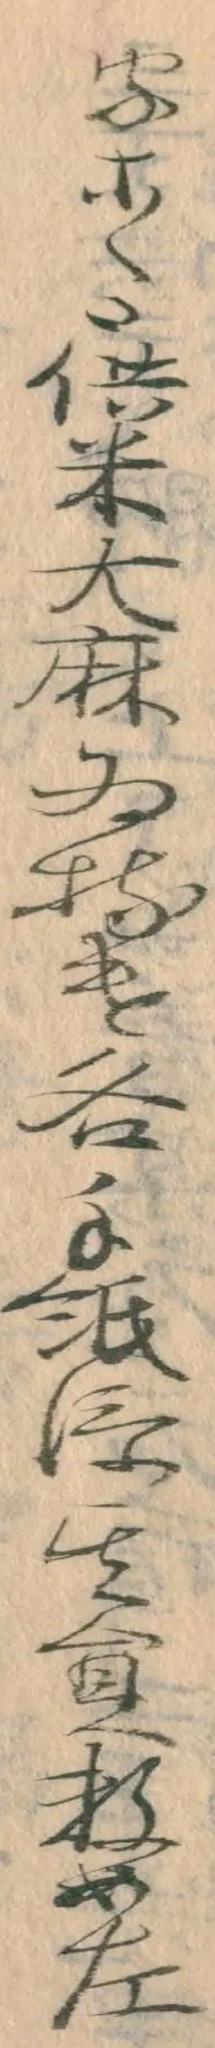家等へ御供米大麻為持遣各手紙添其員数如左
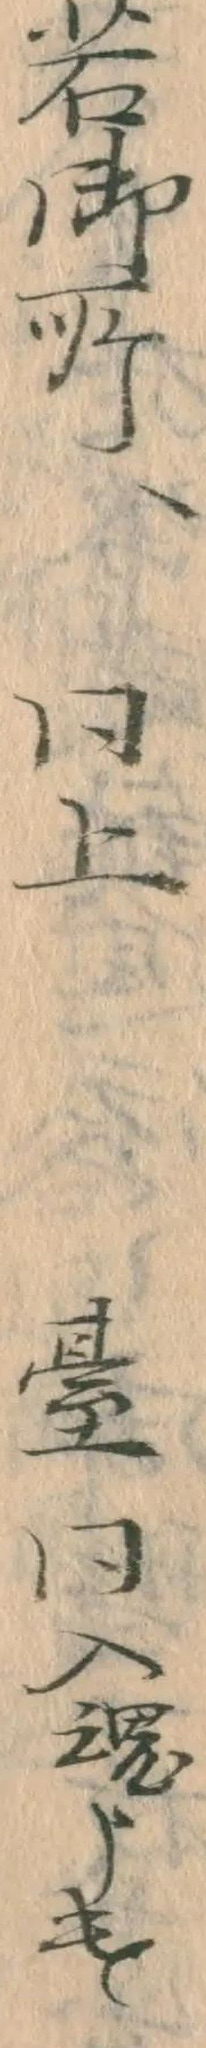若御所へ同上臺同入魂申遣
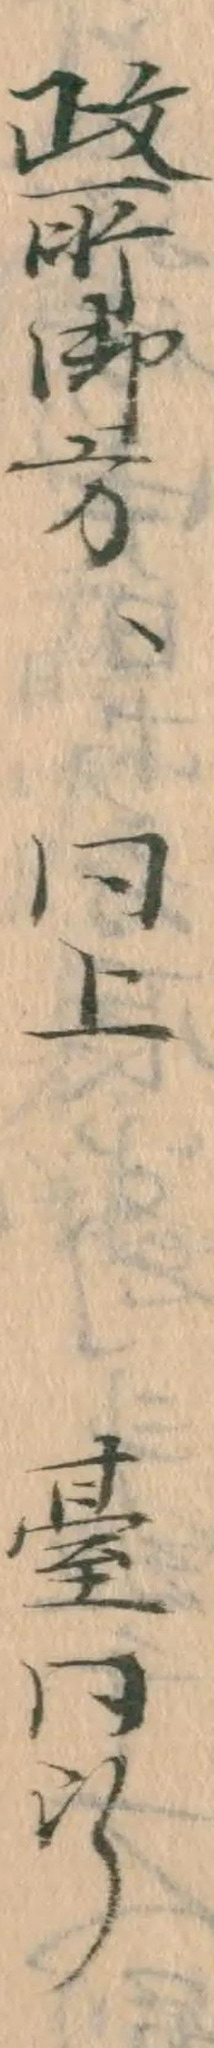政所御方へ同上臺同断
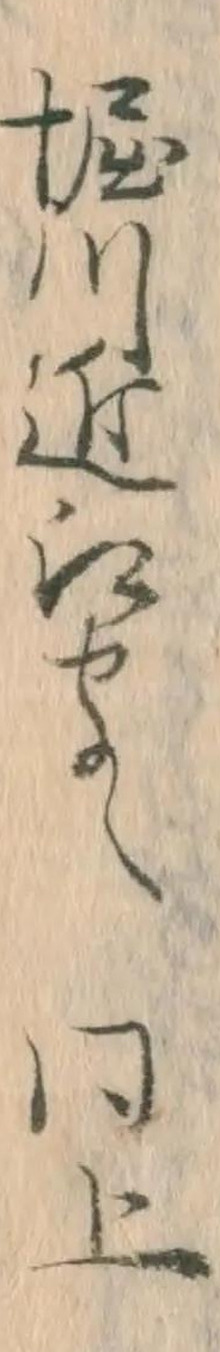堀川近江守へ同上同
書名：賀茂社記録. 第72冊
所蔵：国立国会図書館 National Diet Library, JAPAN
